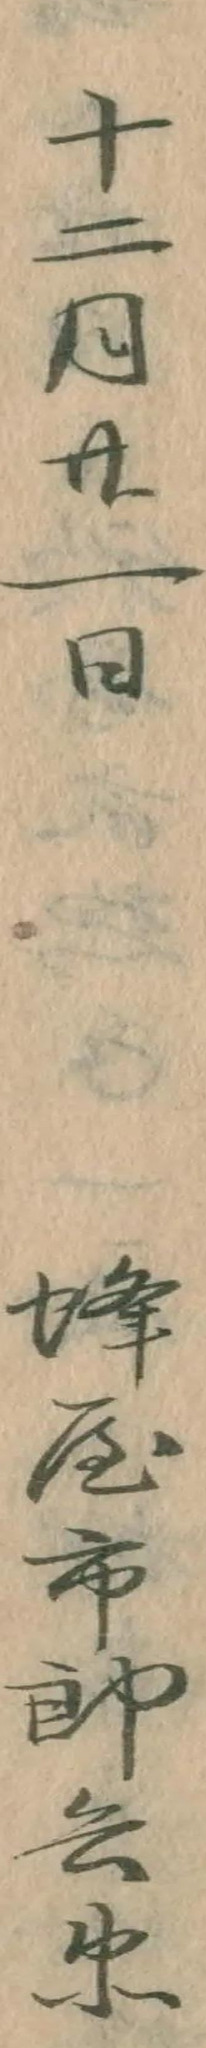十二月廿一日蜂屋市郎兵衛
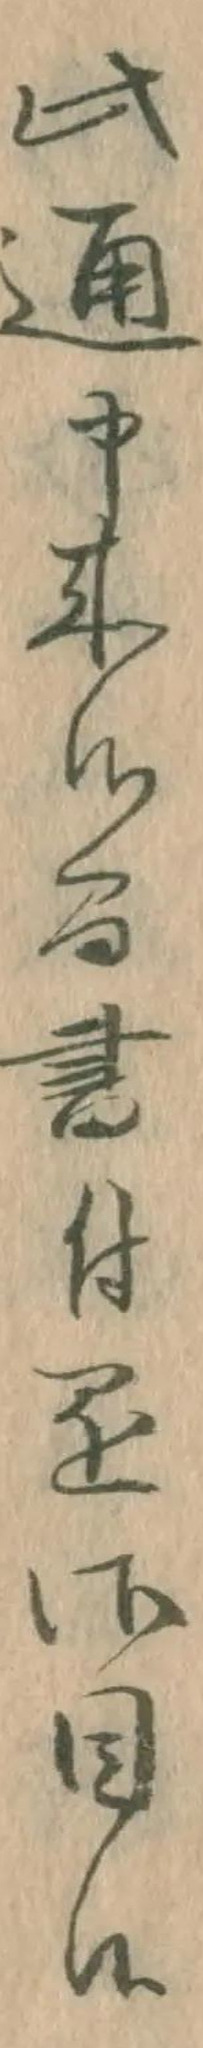此通申来候間書付懸御目候
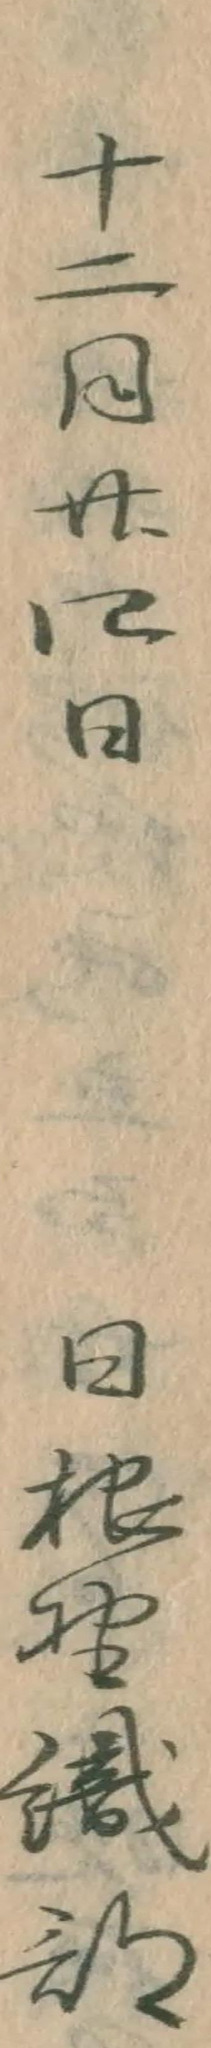十二月廿一日日根野織部
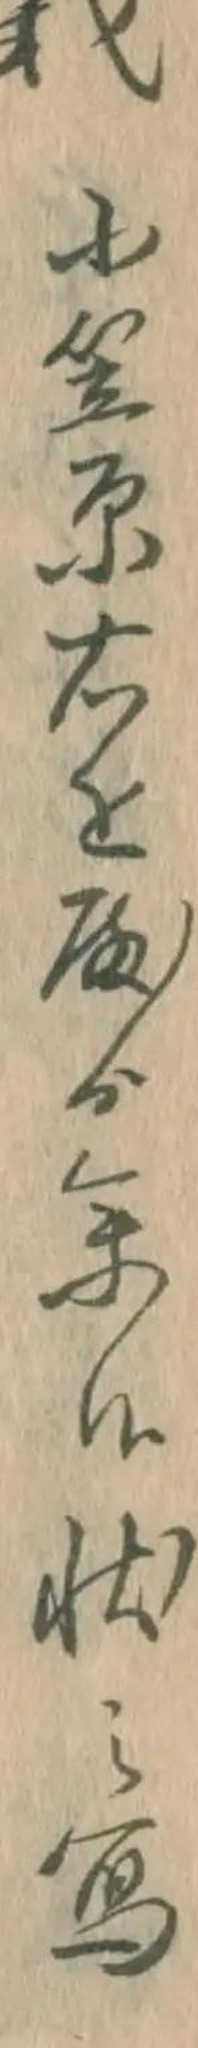又載小笠原右近殿ゟ参候状之写
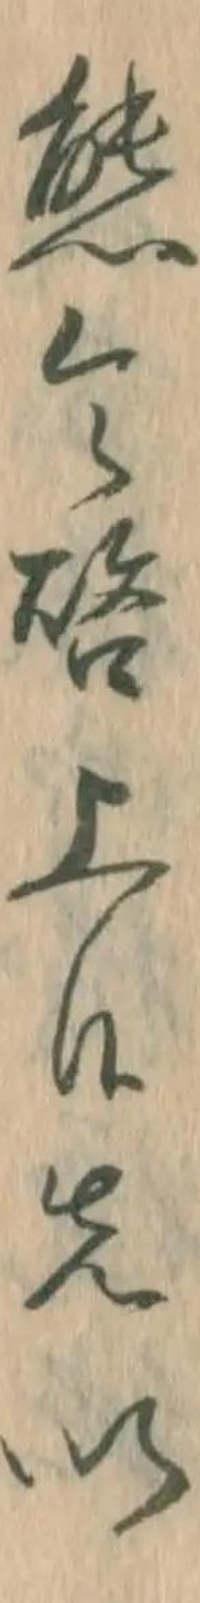熊令啓上候先以

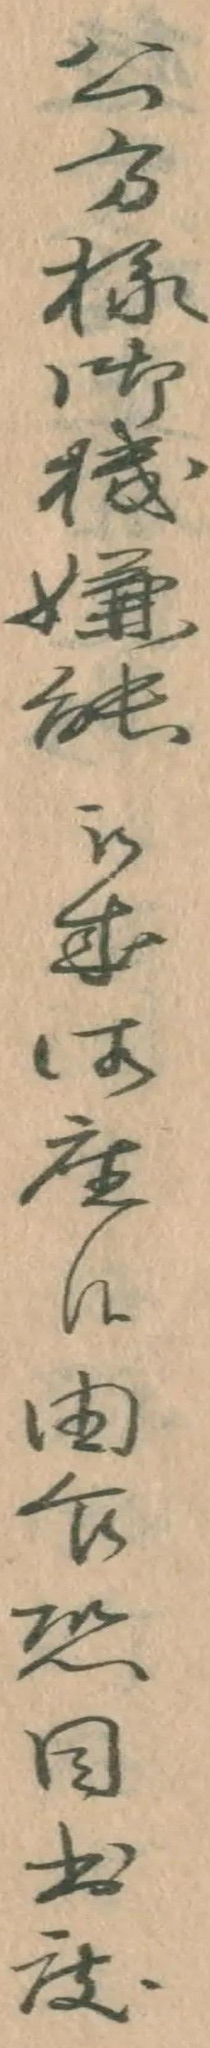公方様御機嫌能被成御座候由乍恐目出度
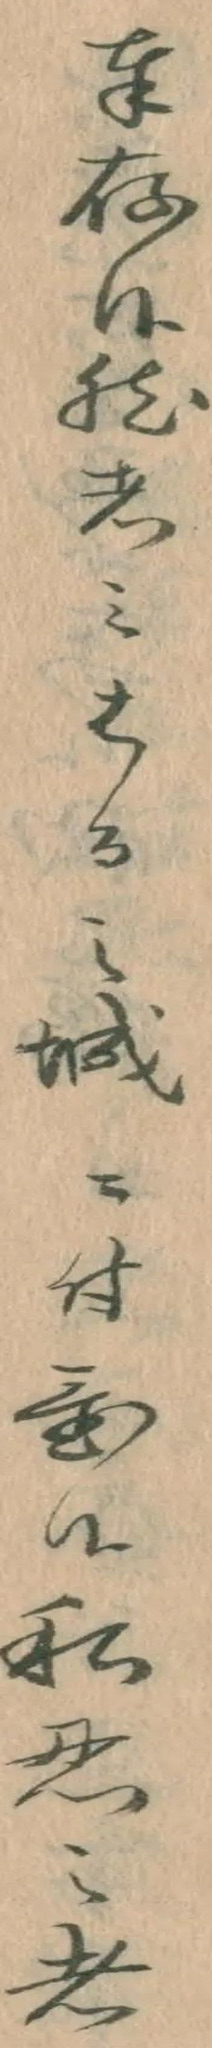奉存候然者みはる之城に付置候私忍之者
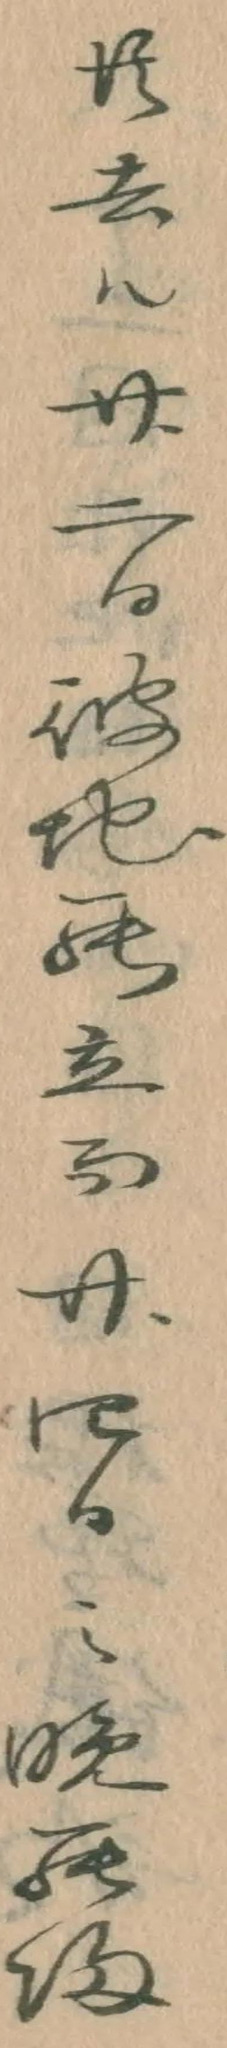共去る廿二日彼地罷立而廿四日之晩罷帰
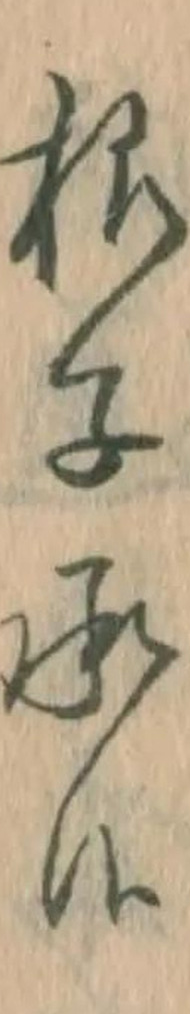様子承候
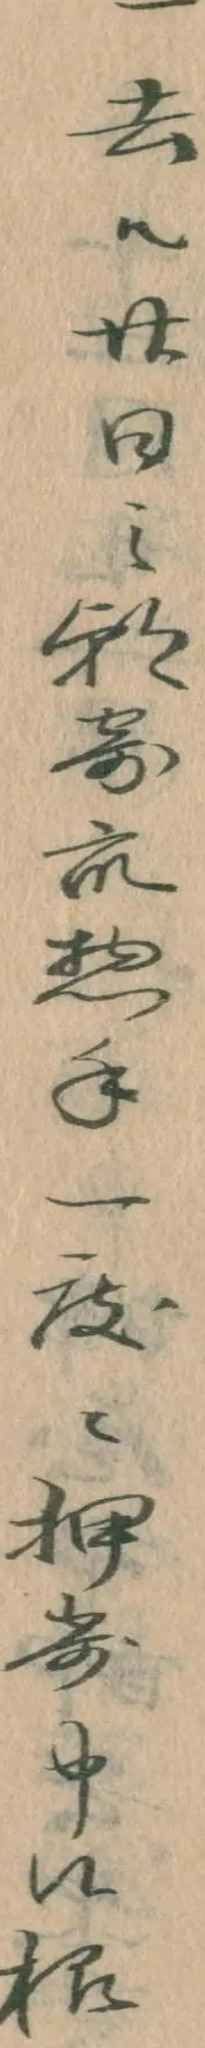一去る廿日之朝寄衆惣手一度に押寄申候様
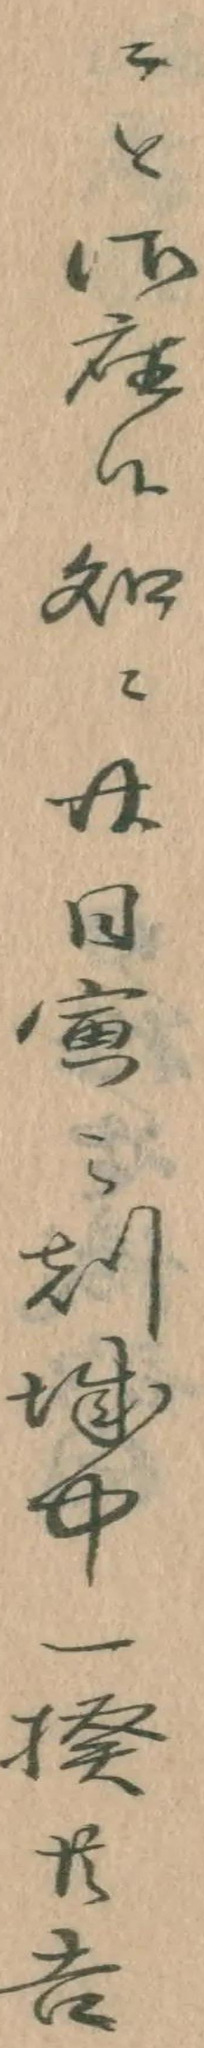にと御座候処に廿日寅之刻城中一揆共吉
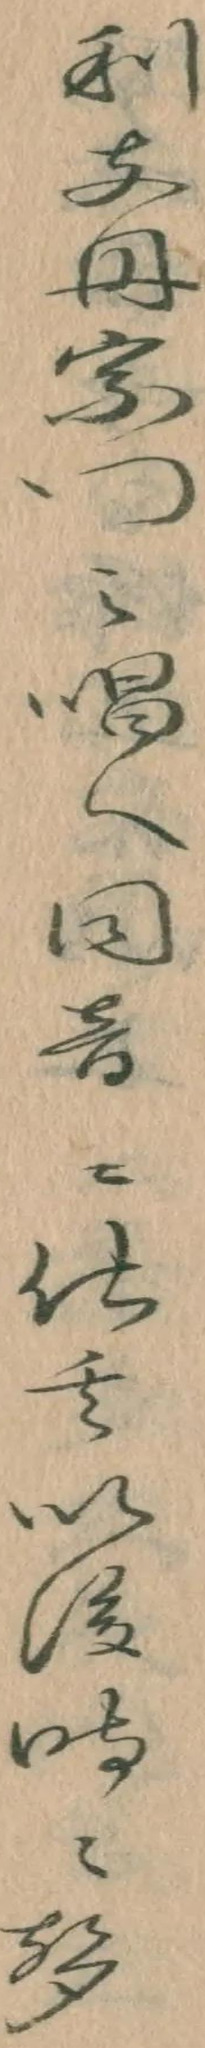利支丹宗門之唱へ同音に仕其以後時に声
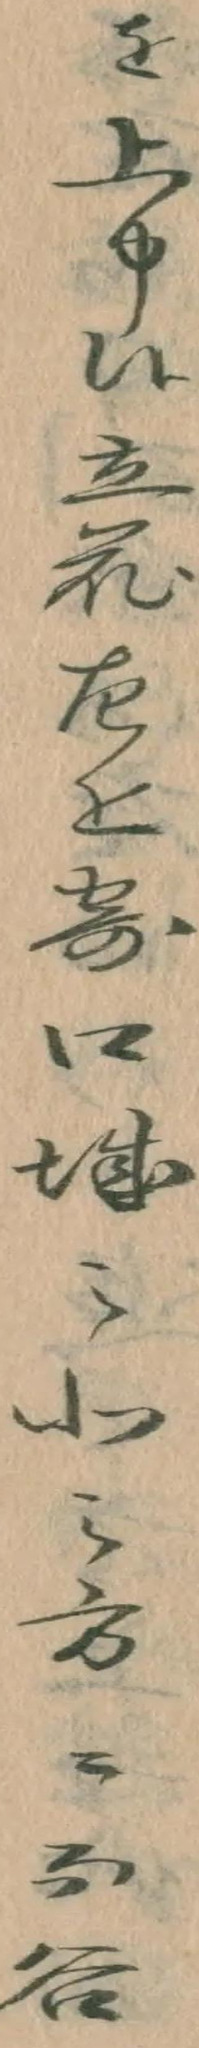を上申候立花左近寄口城之北之方に而谷
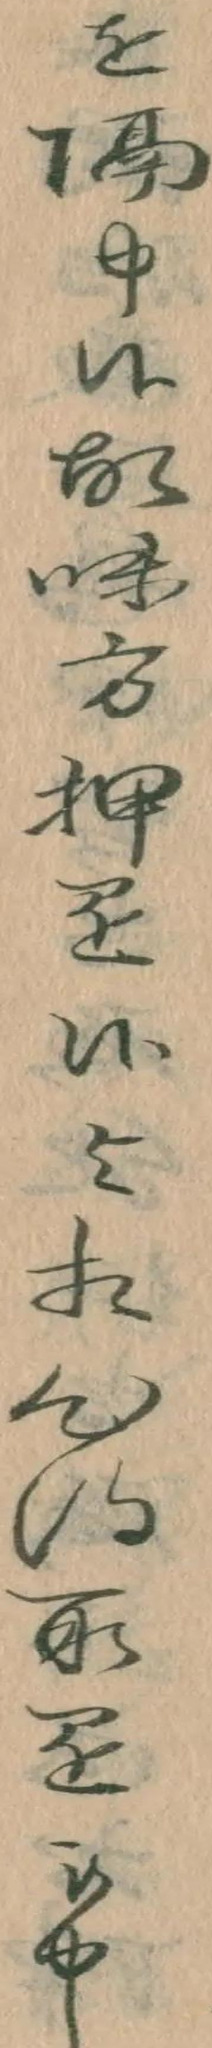を隔申す故味方押懸候与相心得取懸被申
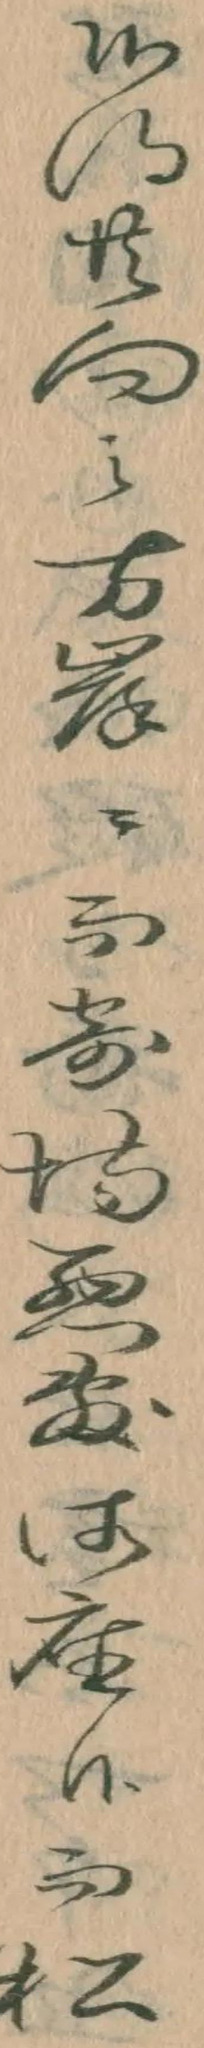候得共向之方岸に而寄場悪敷御座候而松
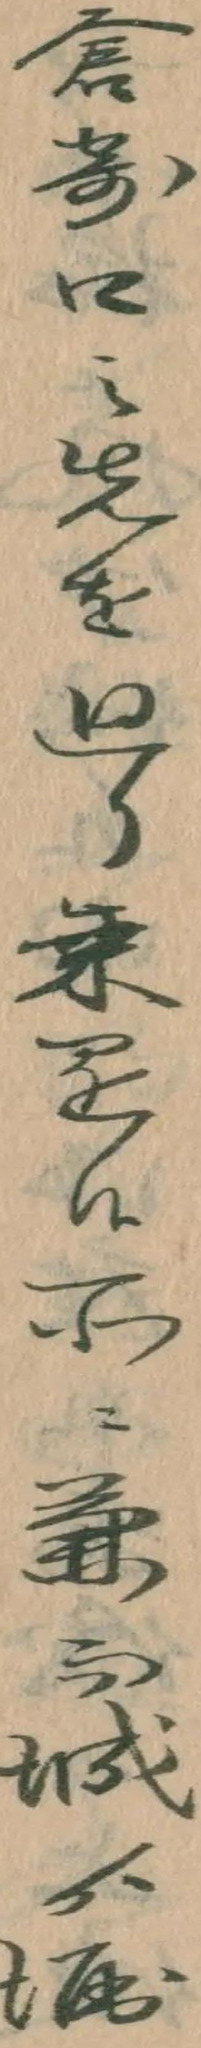倉寄口之先を廻り乗懸候所に兼而城ゟ堀
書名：切支丹御退治記 49巻. [4]
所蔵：国立国会図書館 National Diet Library, JAPAN
